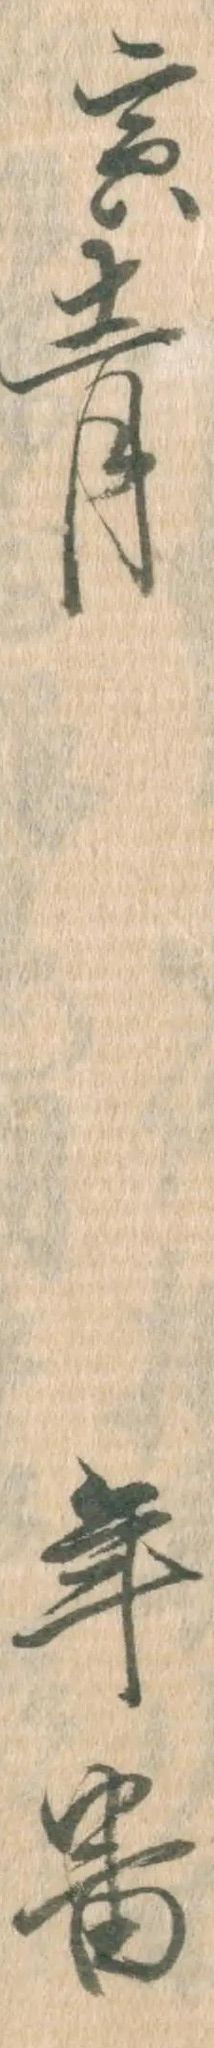寅十二月年番

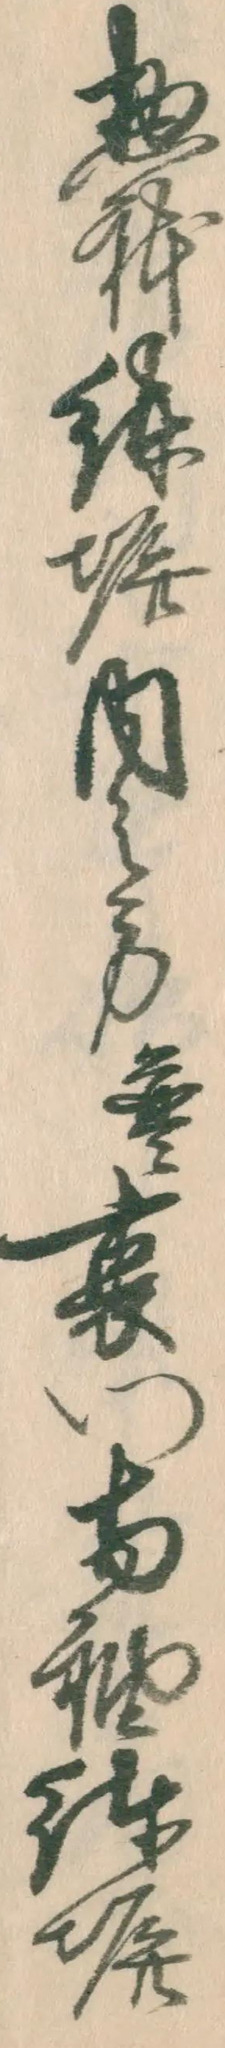惣体煉塀内之方並ニ裏門両袖煉塀
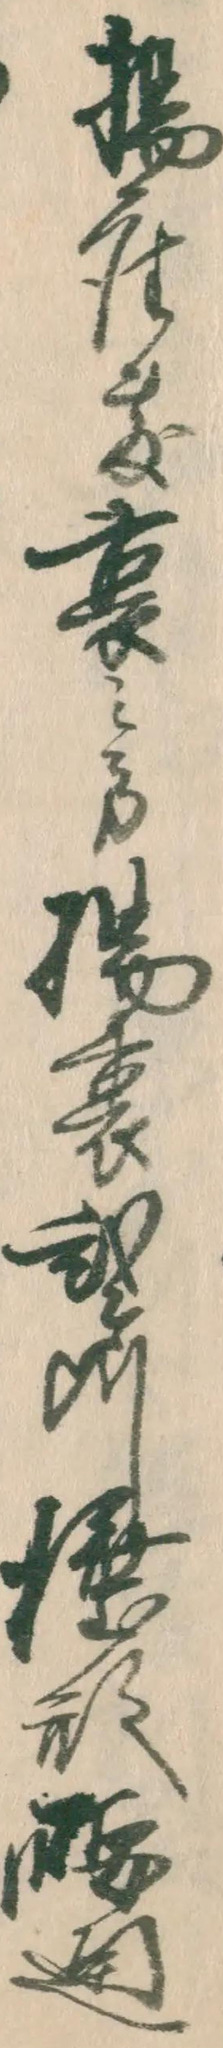揚座敷裏之方揚裏弐ケ所棰形腰通
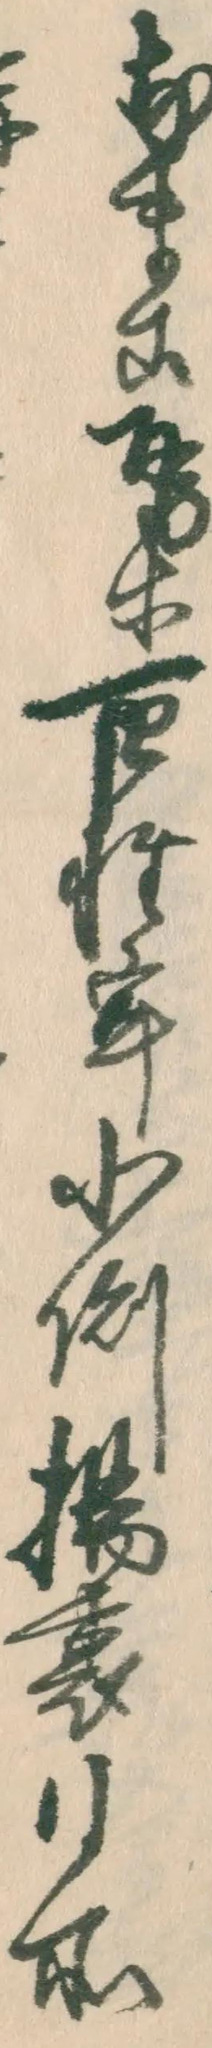なまこ瓦等百姓牢北側揚裏同所
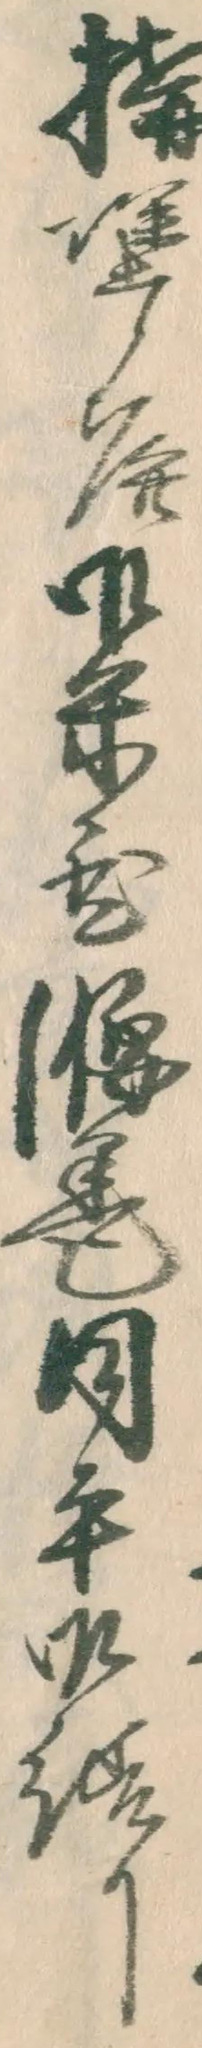構塗り塀御米蔵腰巻同平御繕の
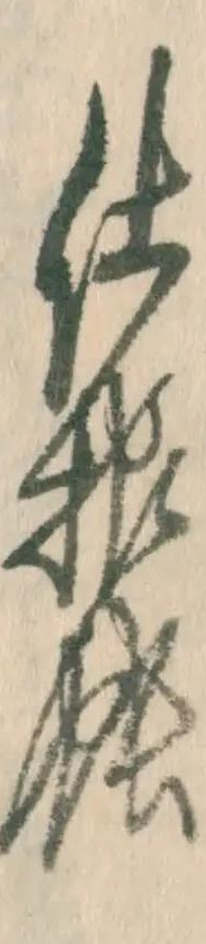仕様帳

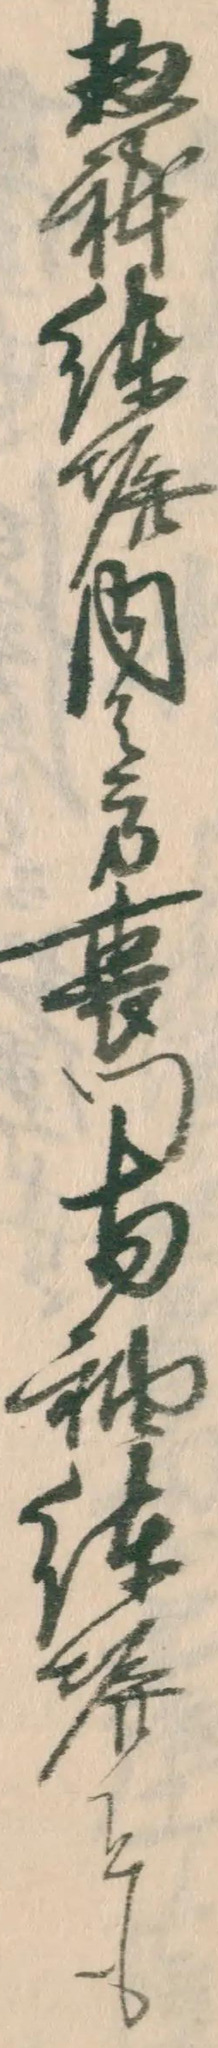一惣体煉塀内之方裏門両袖煉塀とも
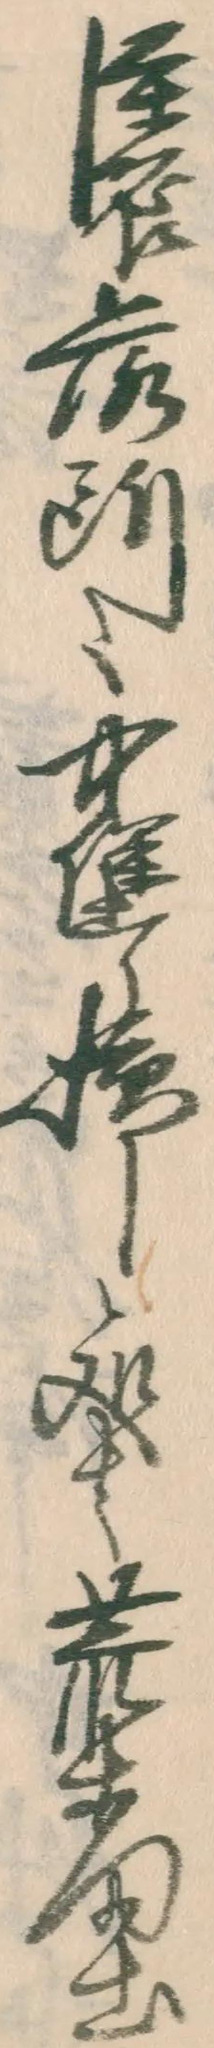漆喰落所〻中塗り損し候処は荒木田土
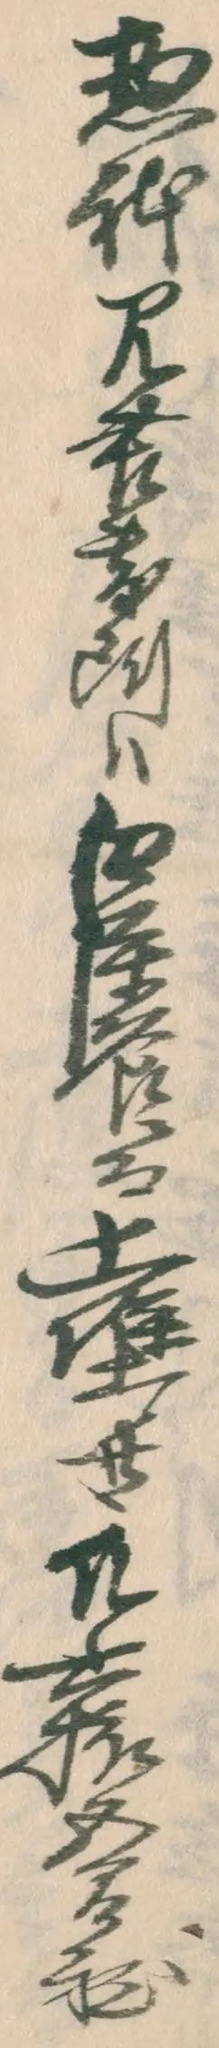惣体見苦敷所ハ白漆喰ニて上塗り共〻凡六拾五間程
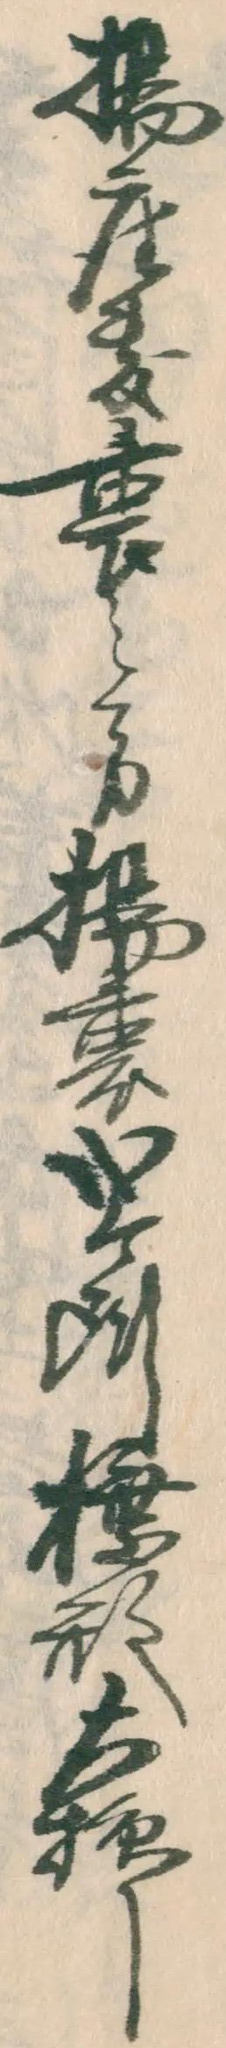一揚座敷裏之方揚裏弐ケ所棰形大損し
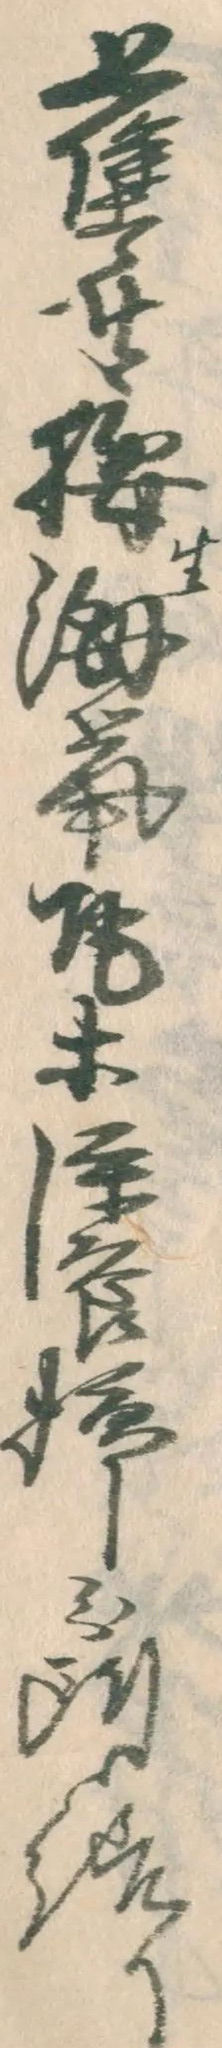上塗り仕候腰海鼠瓦等漆喰損し分所〻繕候

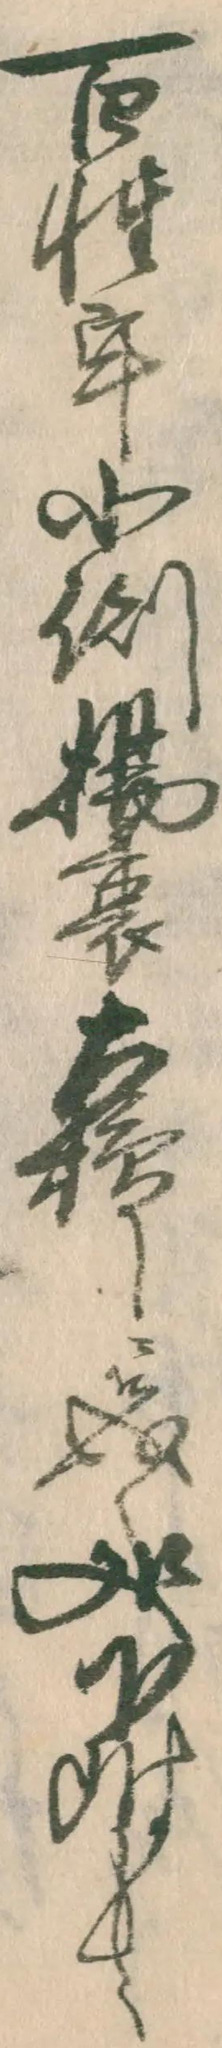一百姓牢北側揚裏大損しニ相成候処下附は
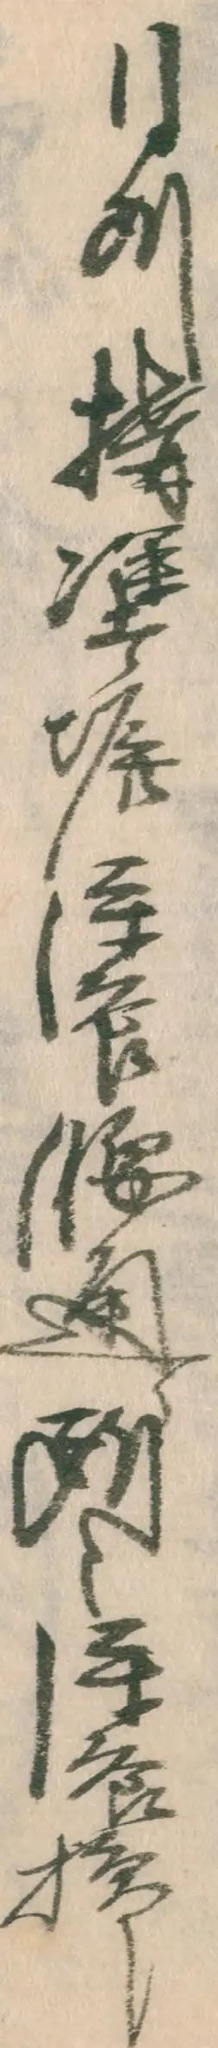一同所構塗り塀漆喰腰通之所之漆喰損し
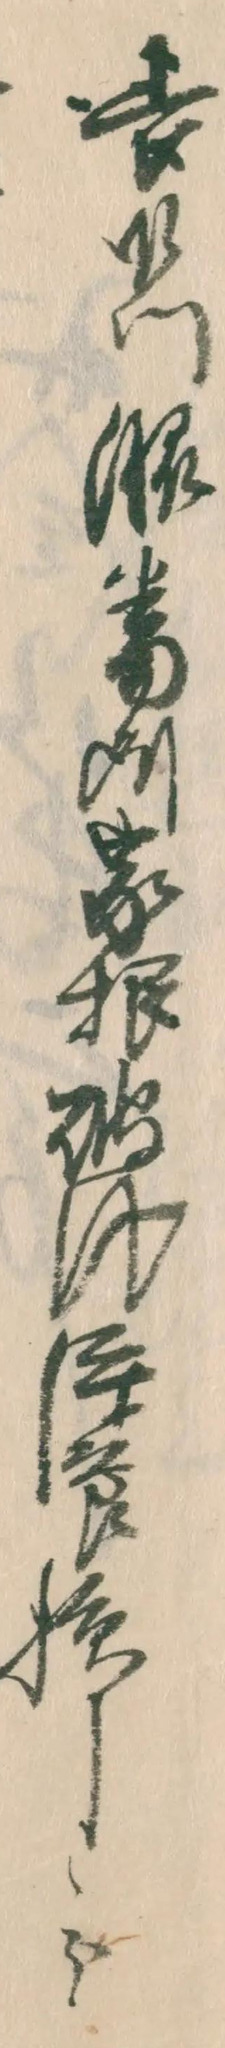一表御門脇番所家根破れ漆喰損し候分
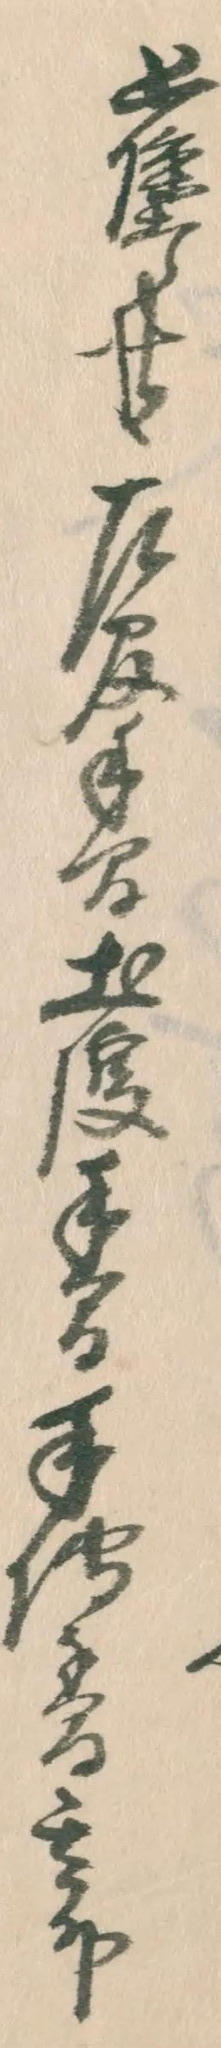上塗り仕候左官手間土浚手間手伝手間其外
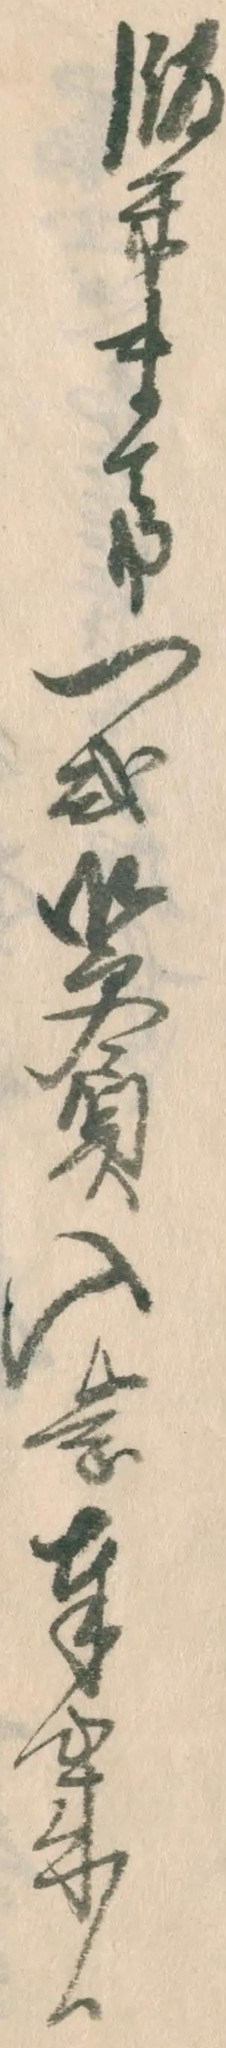飯米まて一式御受負入念奉出来候
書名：七十冊物類集 71巻. [44] 四十三 牢屋敷御普請御修覆地震ニ付骨折候牢屋掛御褒美之部
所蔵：国立国会図書館 National Diet Library, JAPAN
